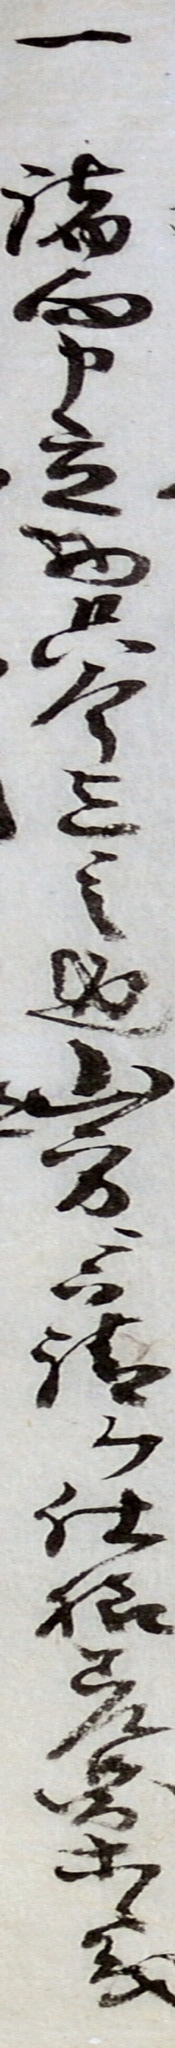一諸向申立物只今迄之通山方ニ而請ケ仕様差図等之義
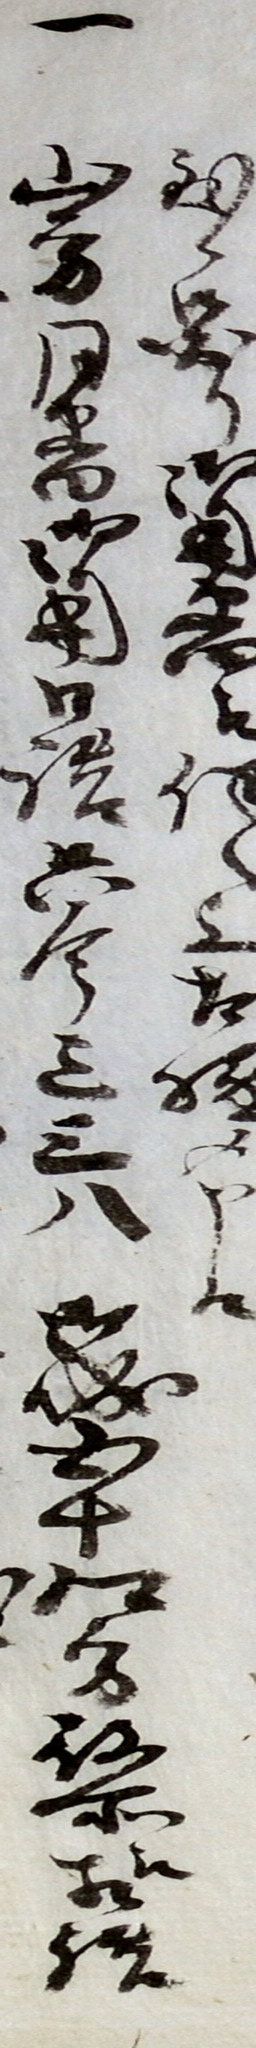一山方月番御用日詰只今迄三八御城五十号郷方役所江相詰
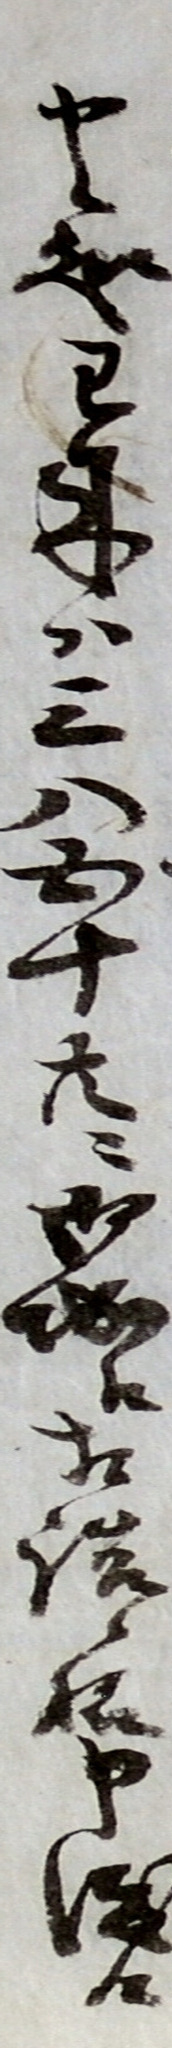申候処已来ハ三八五十共ニ御城江相詰候様申渡候
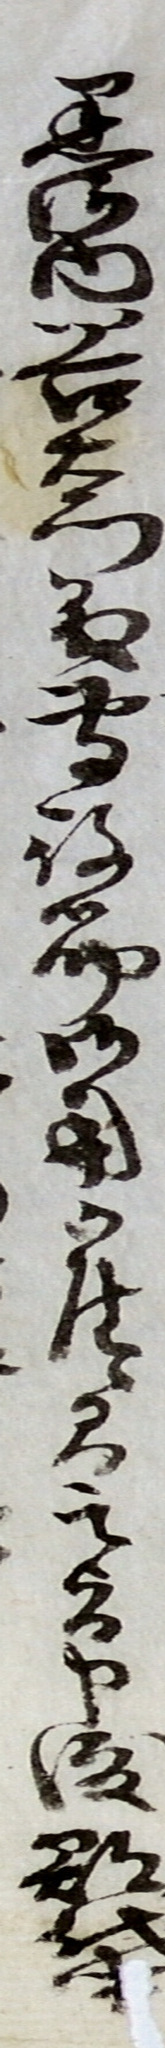一黒河内善右衛門義専約筋御用御座候間其旨申渡郡代中
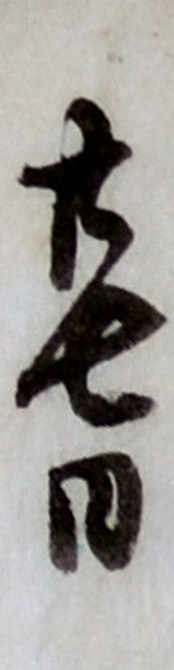廿六日
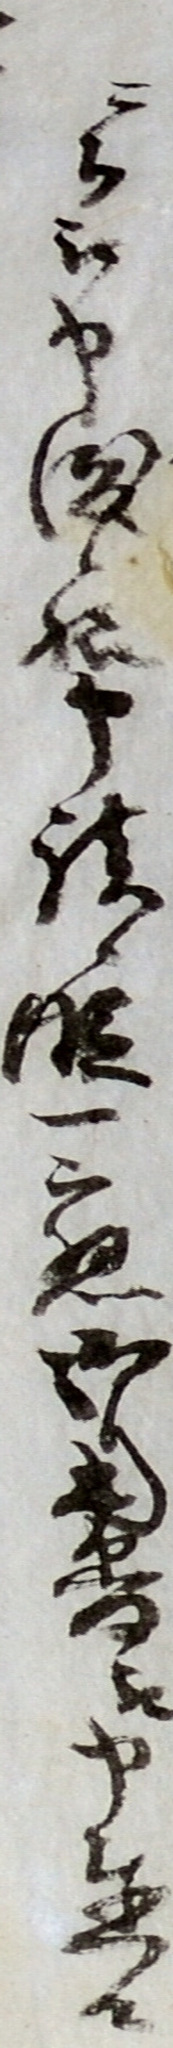二而被申渡候様申談候段一応御用番江申達候

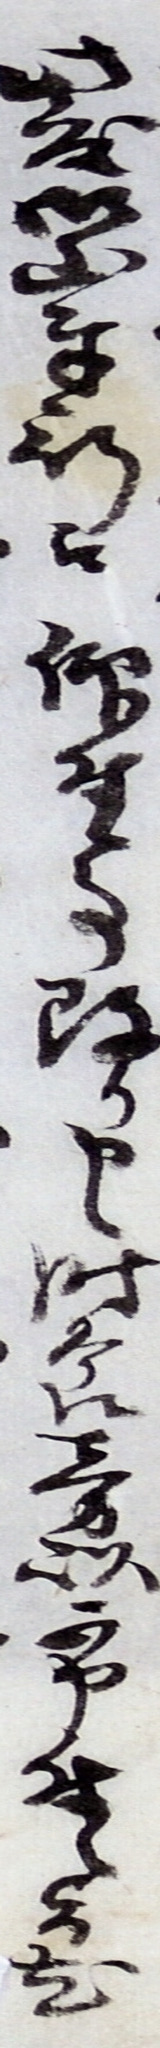此度御山奉行被仰付候事改り申候時節旁以可申付候旨尤
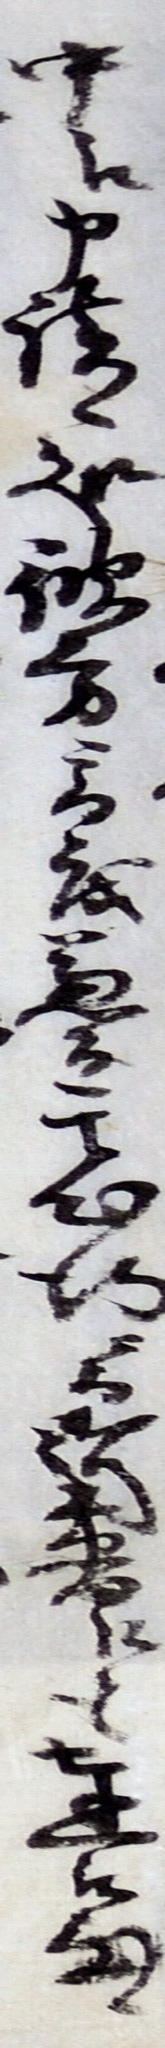中江申談候処彼方ニ而茂兼而其心得ニ而御用番江も達被置候
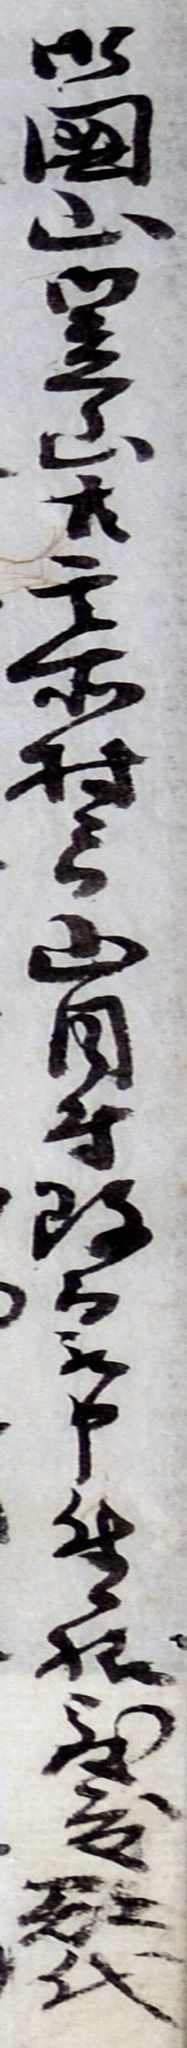一御国山御立山共其所村々二而山目付改而被申付候様致度郡代
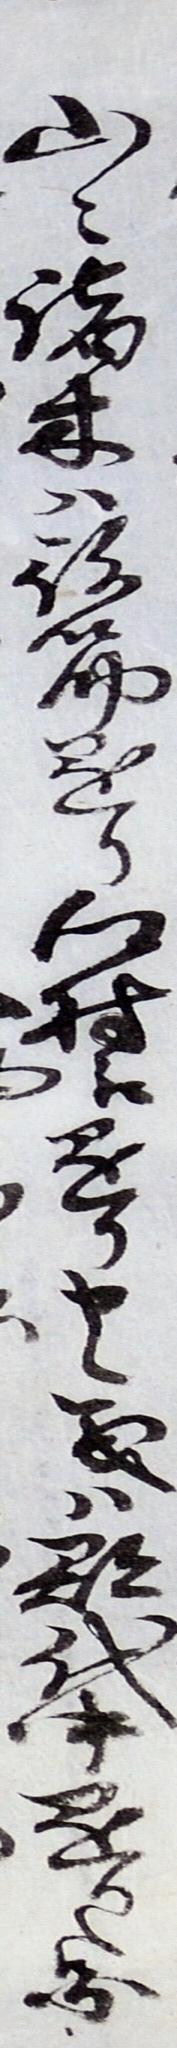一山々諸木ハ約筋懸り郷村江懸り申候義ハ郡代中懸り与図
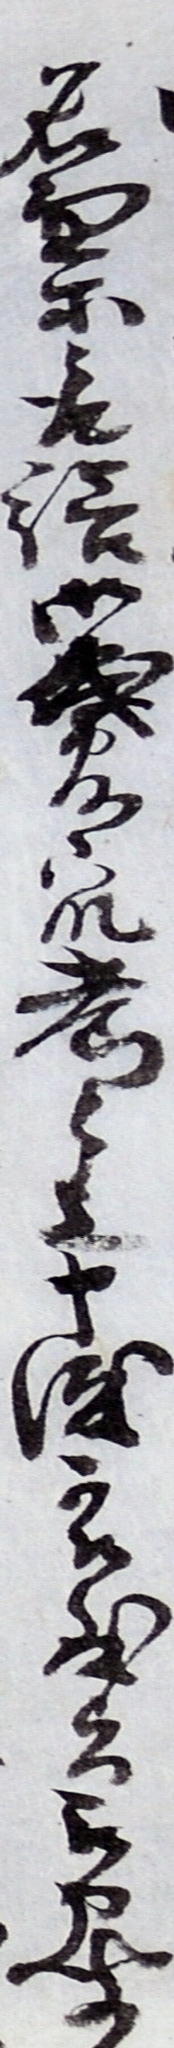名面等取繕御代官衆考とも申渡可被致旨被申聞候
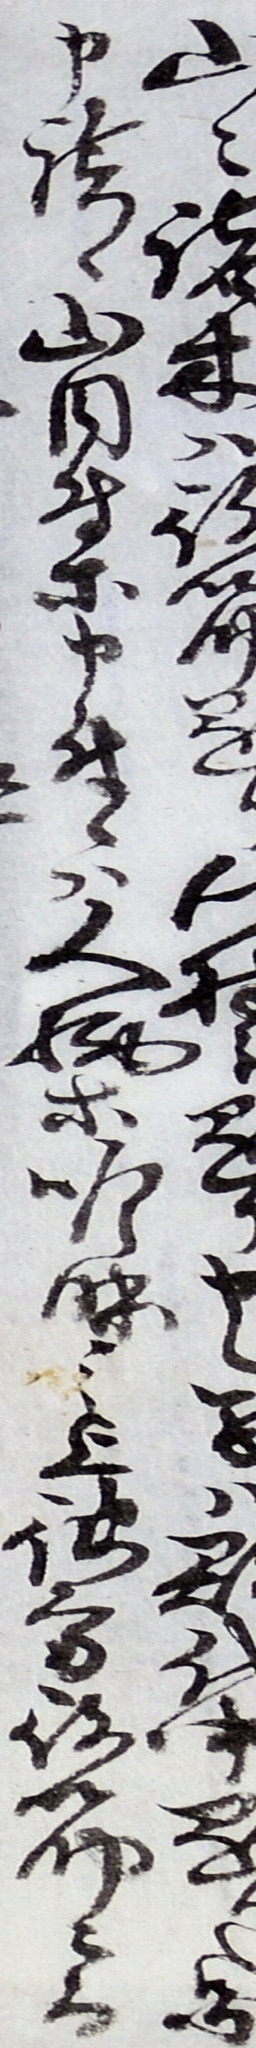申談候山目付等申付候ハ人柄等吟味之上彼方役筋ニ而
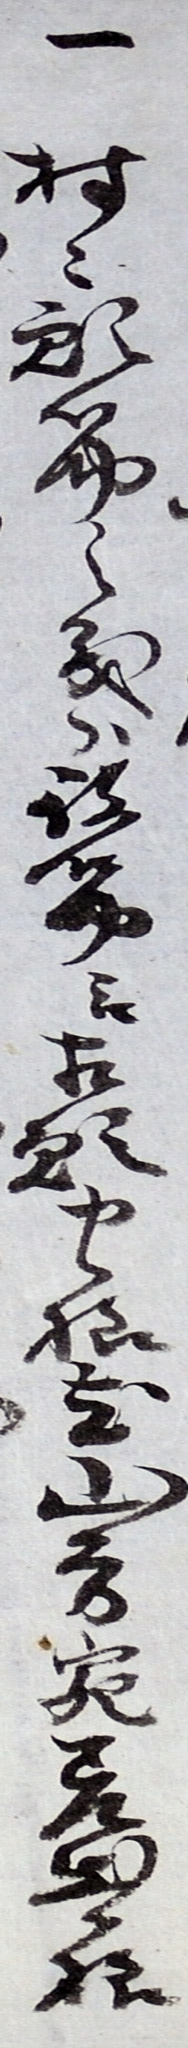一村々願筋之義ハ役筋江相願申候様尤山方宛差出候様
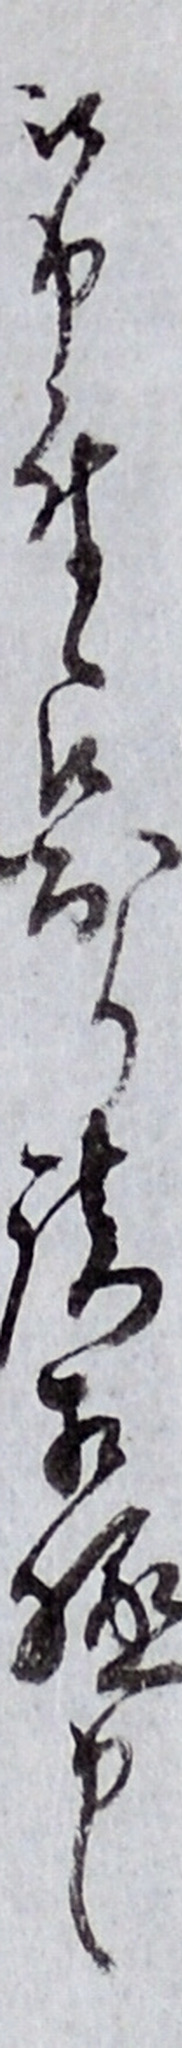被申付候図り諸相極申候
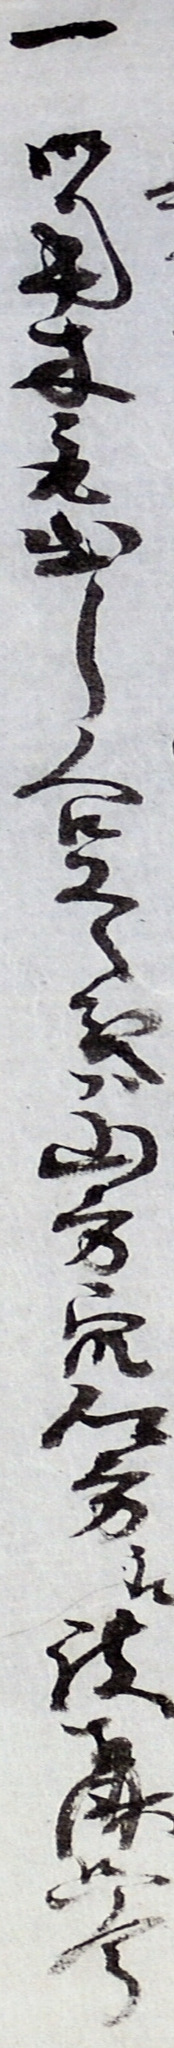一御用木取出し人江かへし候義ハ山方衆郷方江致相済只今
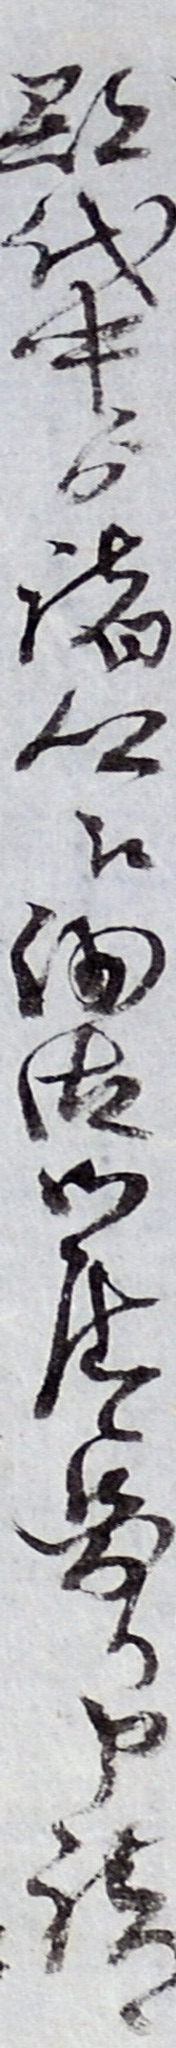郡代中ゟ諸郷江沙汰御座候圖り申談候
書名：御山奉行御用留
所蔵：伊那市立高遠町図書館・合同会社AMANE
